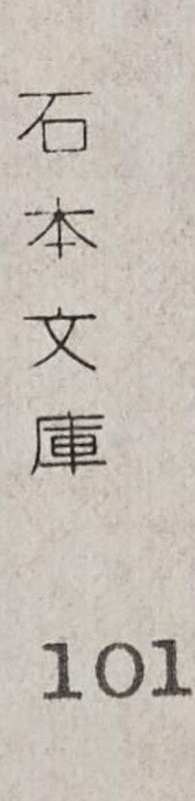石本文庫
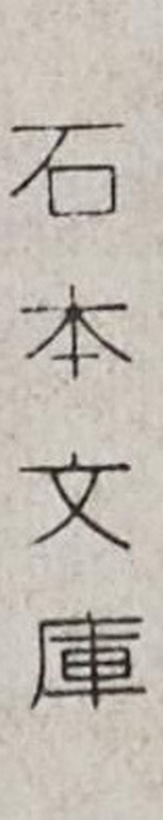石本文庫
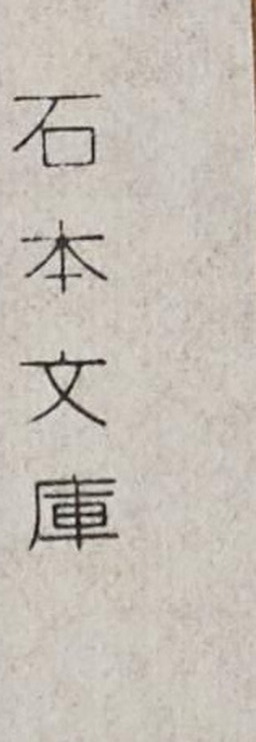石本文庫

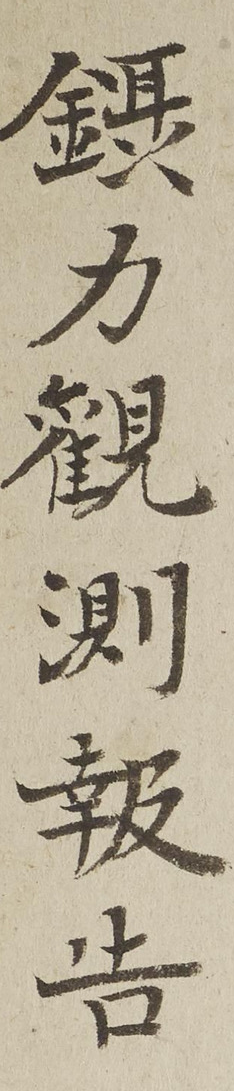鑷力観測報告

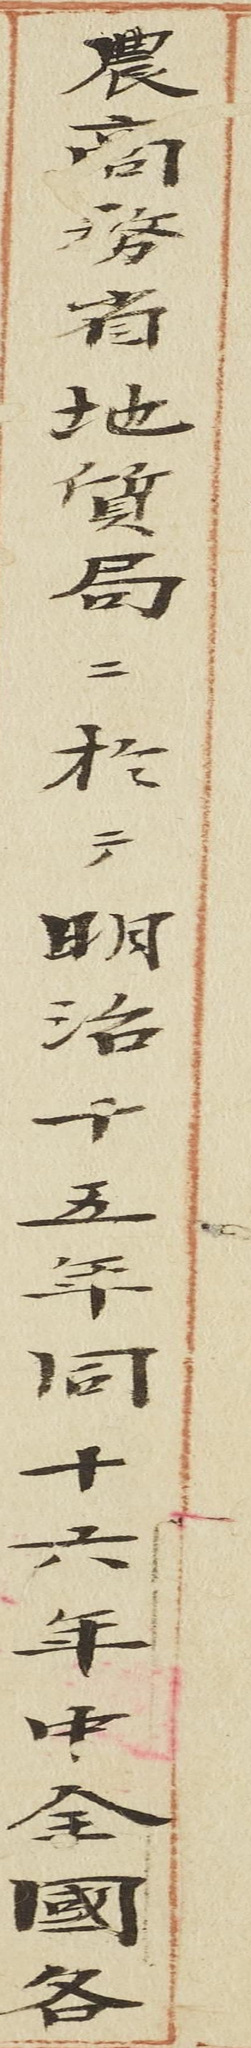農商務省地質局ニ於テ明治十五年同十六年中全國各
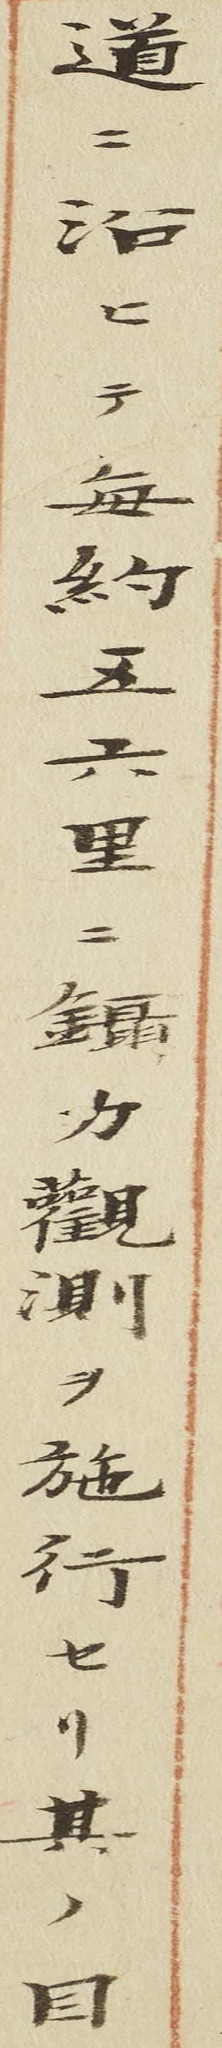道ニ沿ヒテ毎約五六里ニ鑷力觀測ヲ施行セリ其ノ目
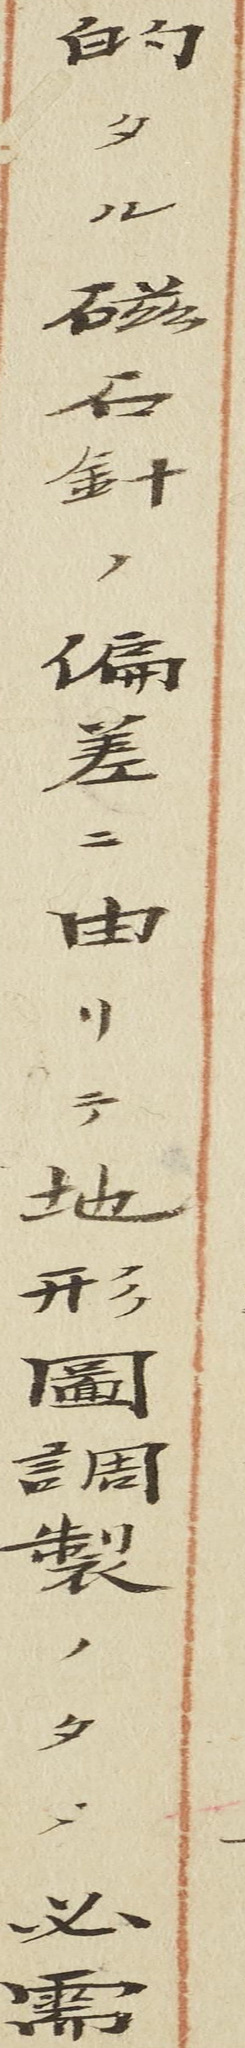的タル磁石針ノ偏差ニ由リテ地形圖調整ノタメ必需
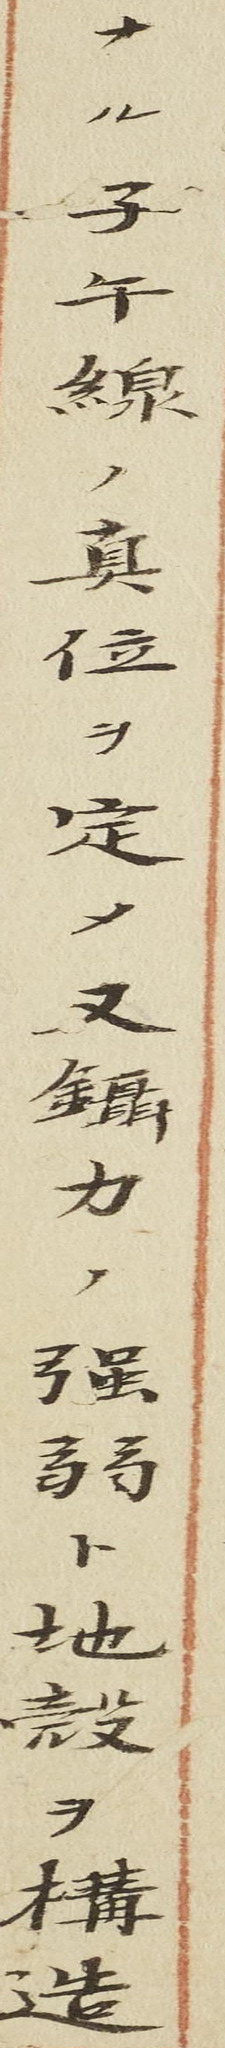ナル子午線ノ真位ヲ定メ又鑷力ノ强弱ト地殻ヲ構造
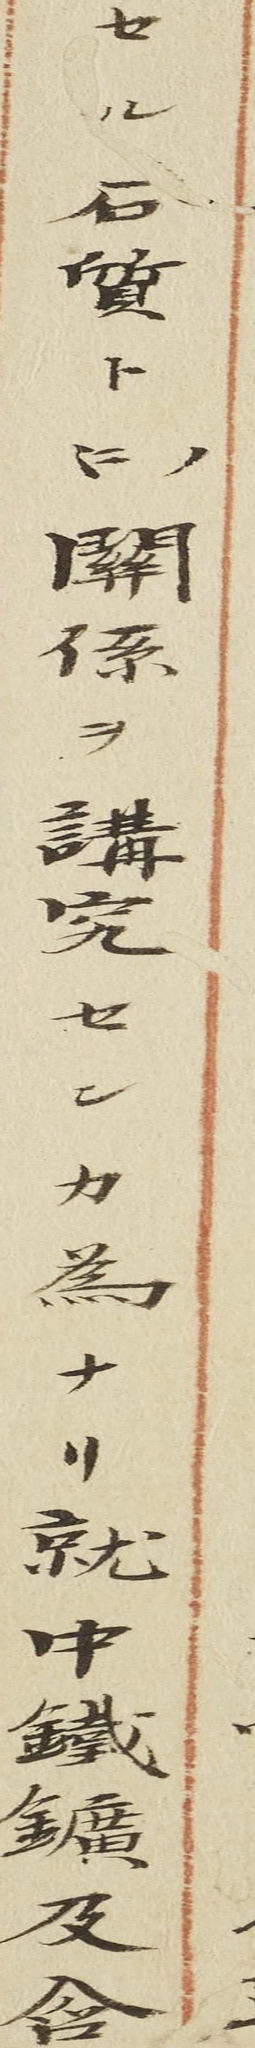セル石質トノトキ關係を講究センカ為ナリ就中鐵鑛及含
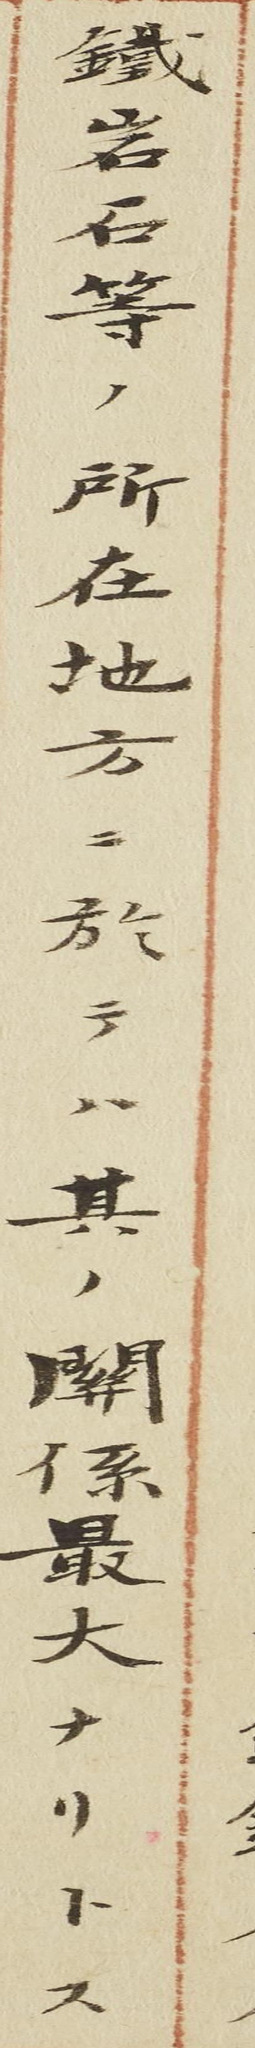鐵岩石等ノ所在地方ニ於テハ其ノ關係最大ナリトス
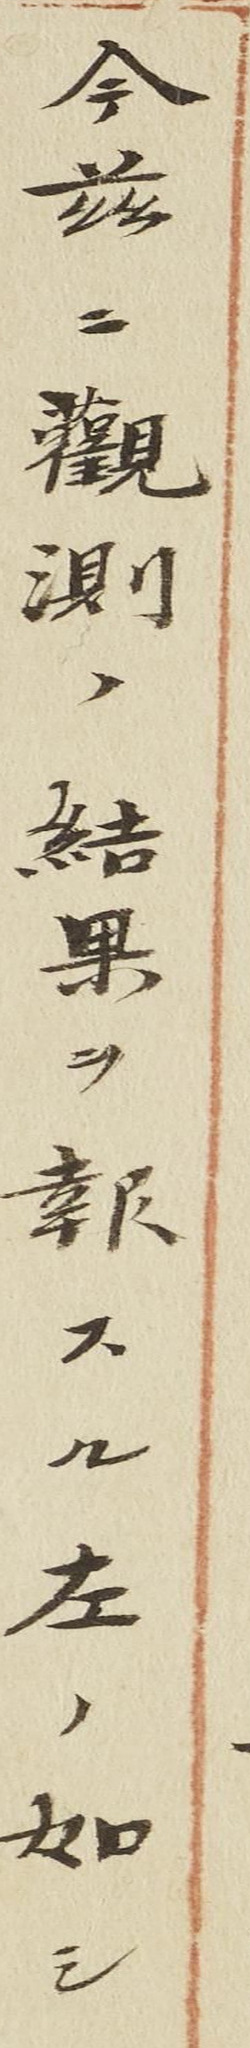今兹ニ觀測ノ結果ヲ報スル左ノ如シ
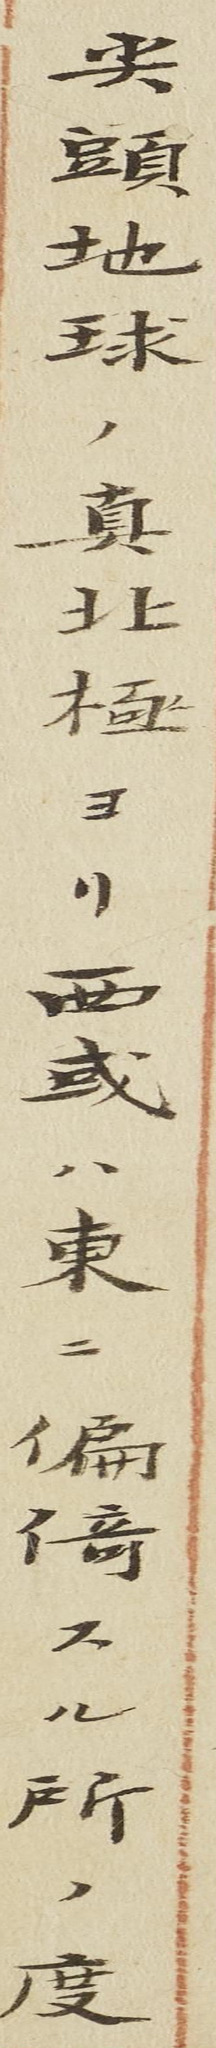央頭地球ノ真北極ヨリ西或ハ東ニ遍𠋣スル所ノ度
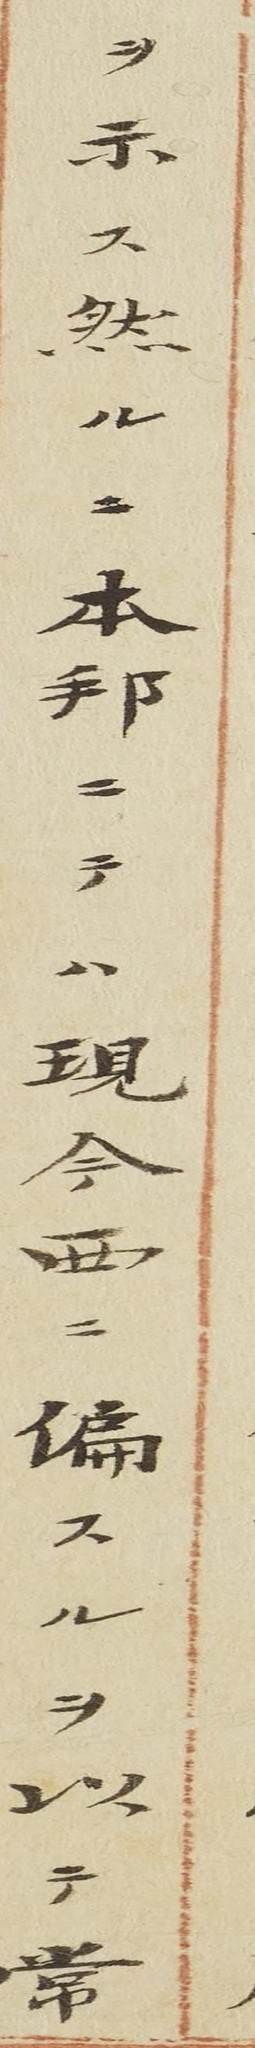ヲ示ス然ルニ本邦ニテハ現今西ニ偏スルヲ以テ常
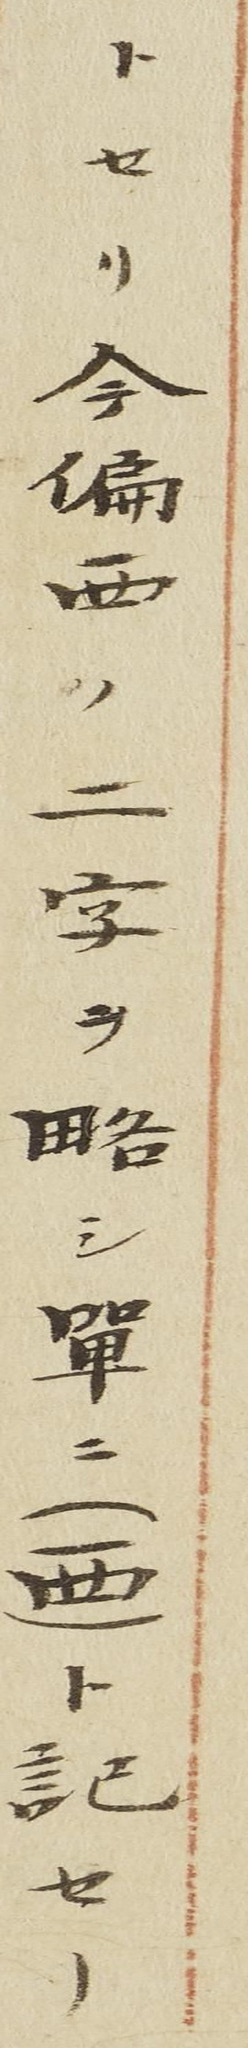トセリ今偏西ノ二字ヲ略シ單ニヲ記セリ

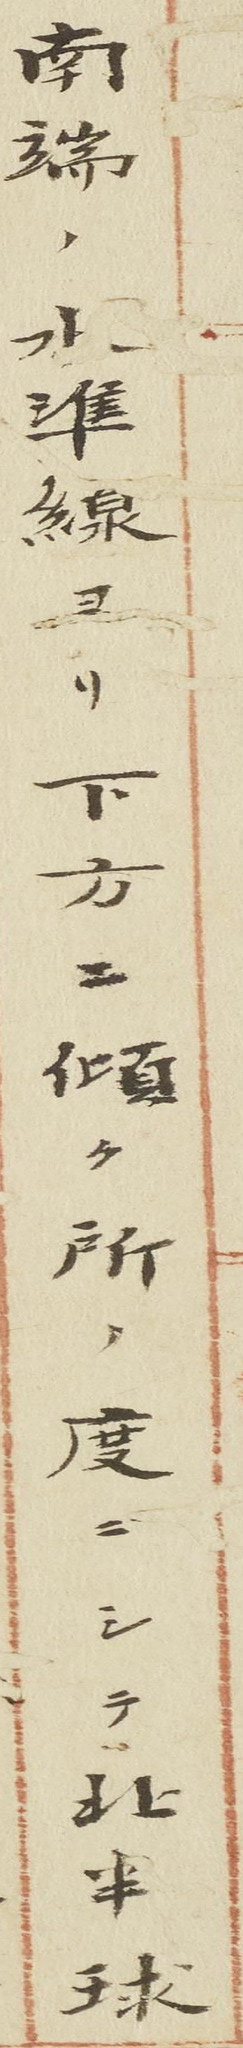南端ノ水準線ヨリ下方ニ傾ク所ノ度ニシテ北半球
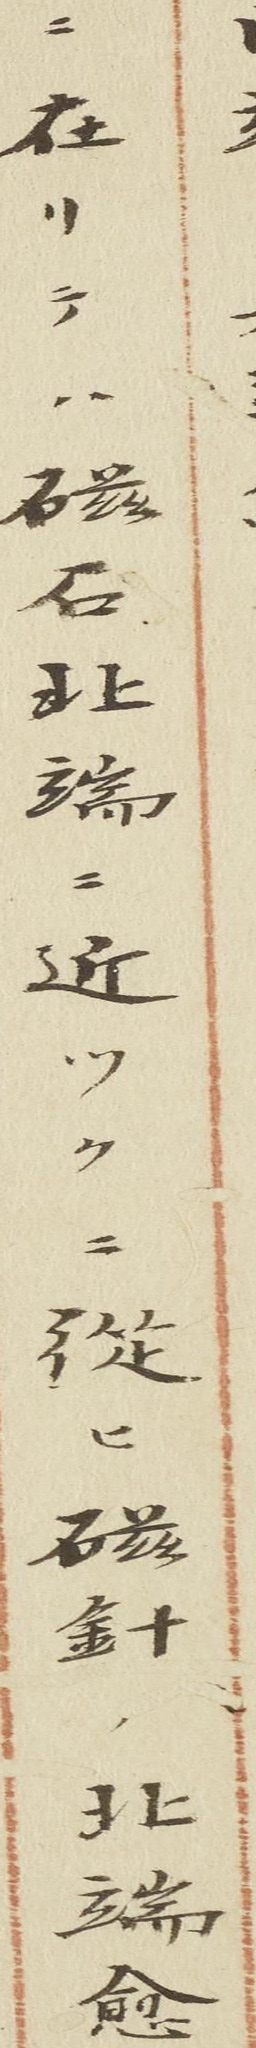ニ在リテハ磁石北端ニ近ツクニ従ヒ磁針ノ北端愈
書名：鑷力観測報告
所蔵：東京大学地震研究所図書室 Earthquake Research Institute Library, The University of Tokyo, JAPAN
